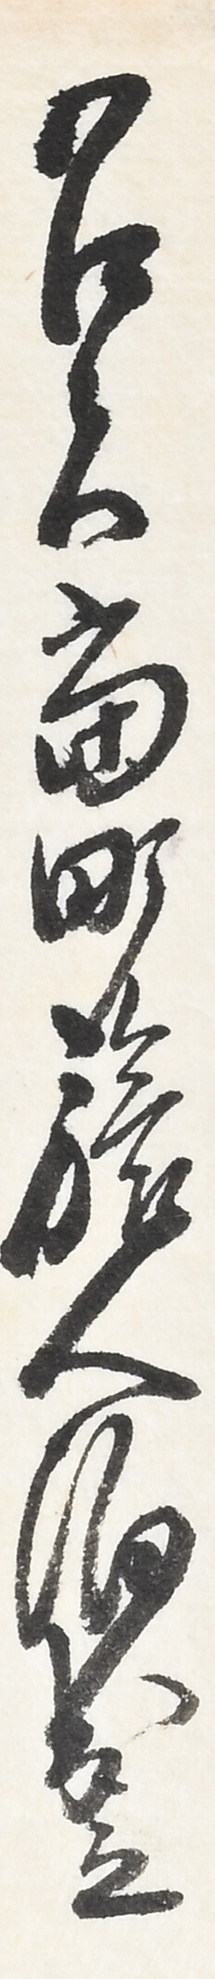右者当町旅人泊出立
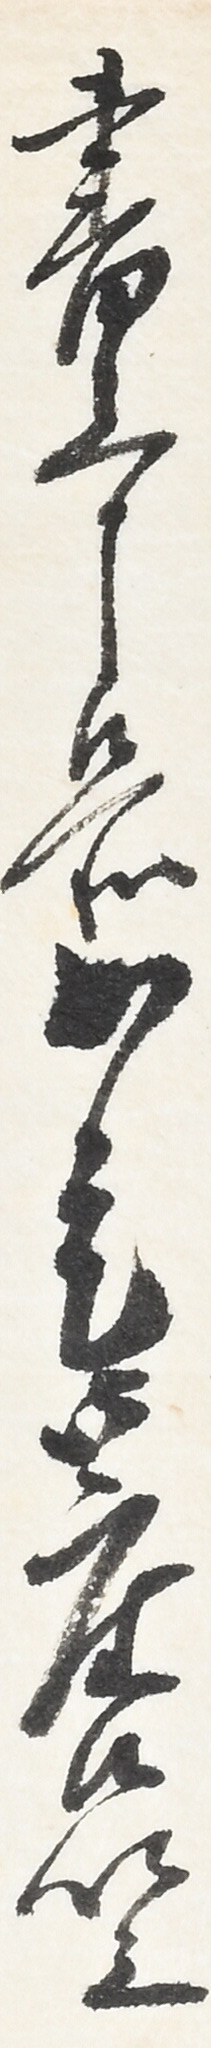書上申候所如是御座候以上
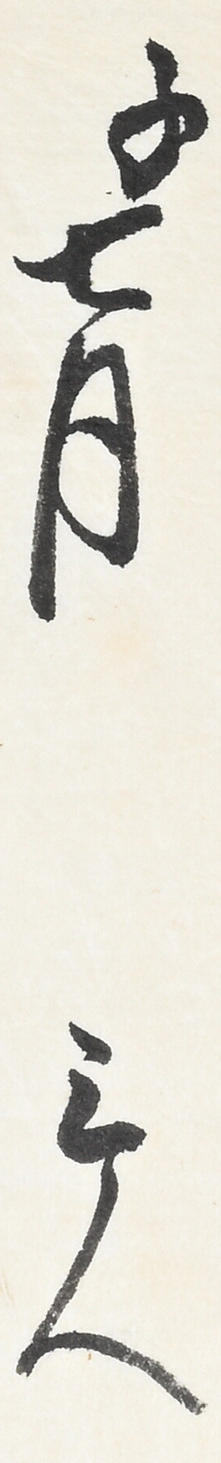子七月三人

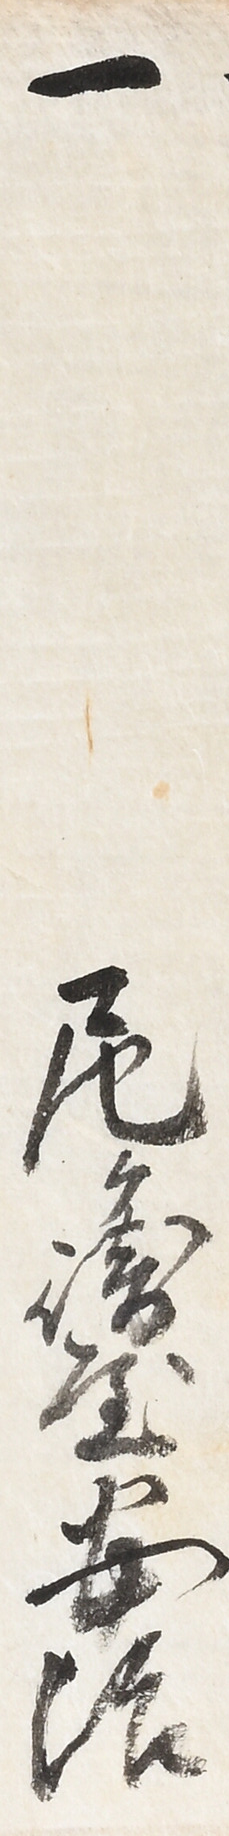一尼ヶ崎屋安治
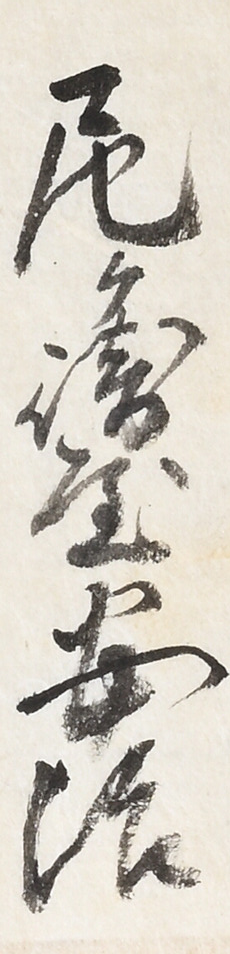一尼ヶ崎屋安治
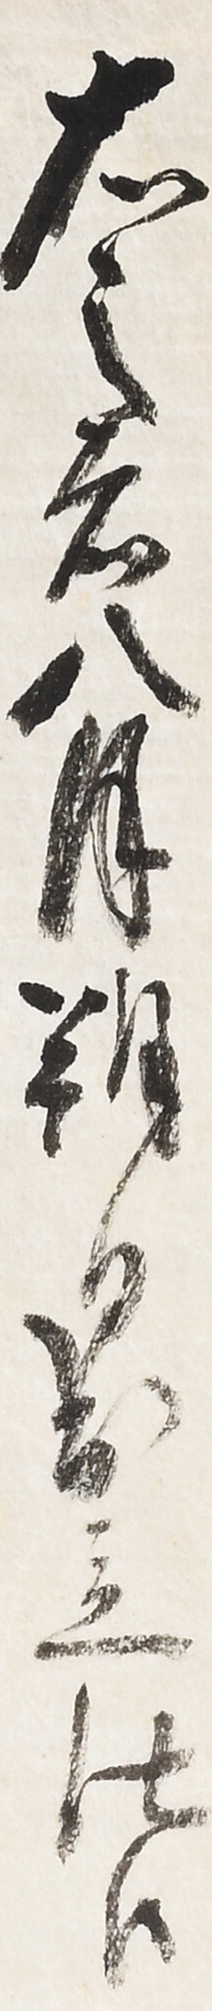右之者八月朔日出立仕候
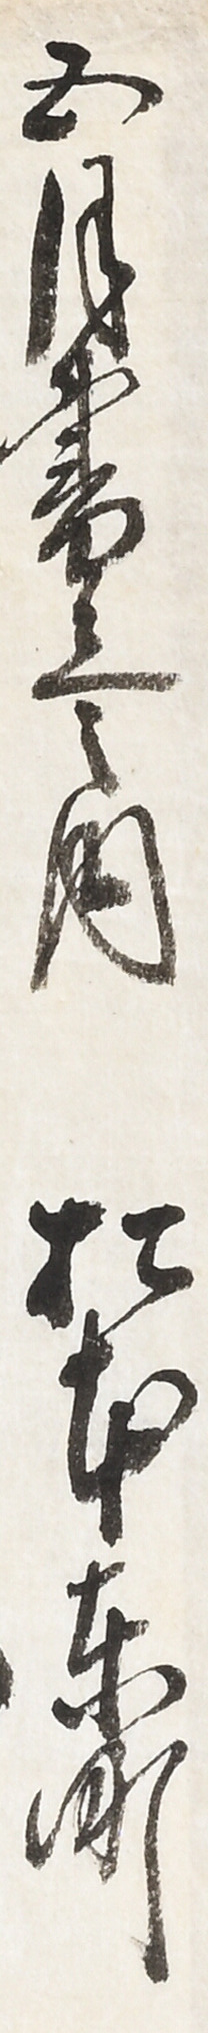五月書上之内松本東町
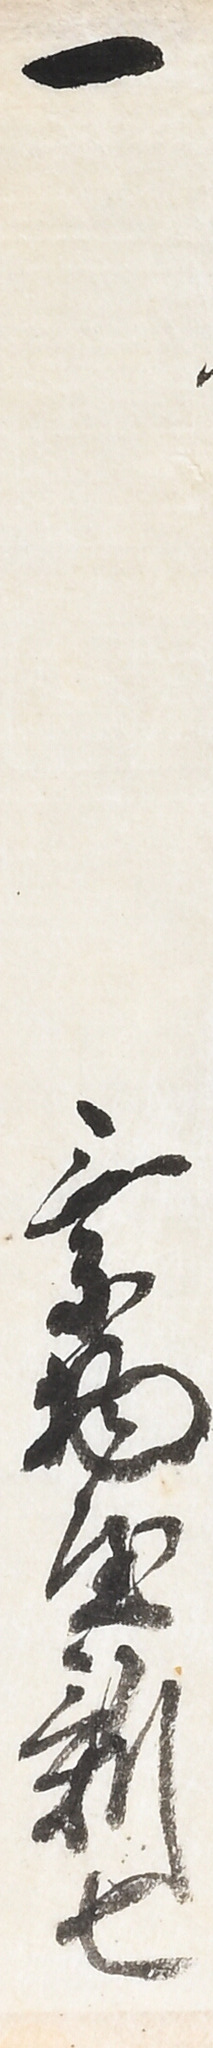一乗物屋新七
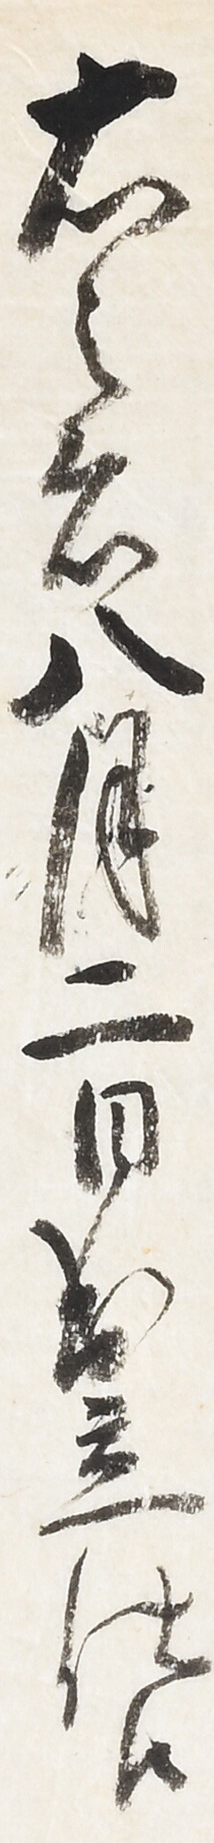右之者八月二日出立仕候
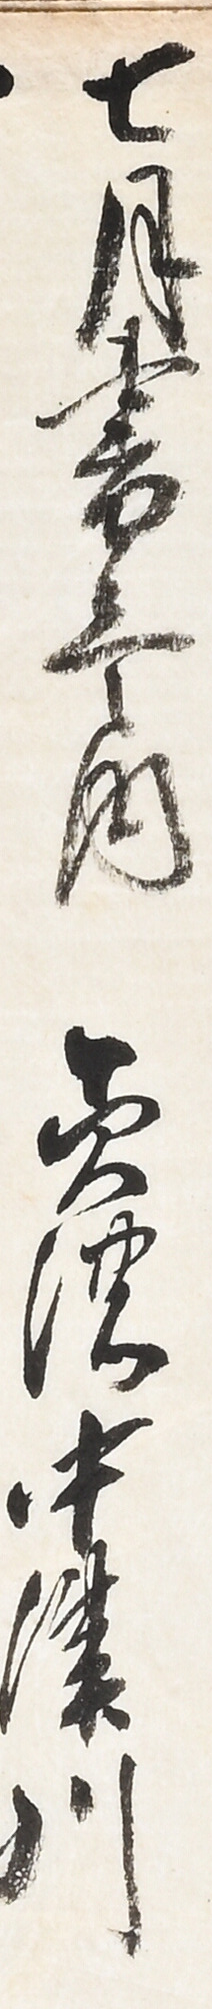七月書上之内美濃中津川
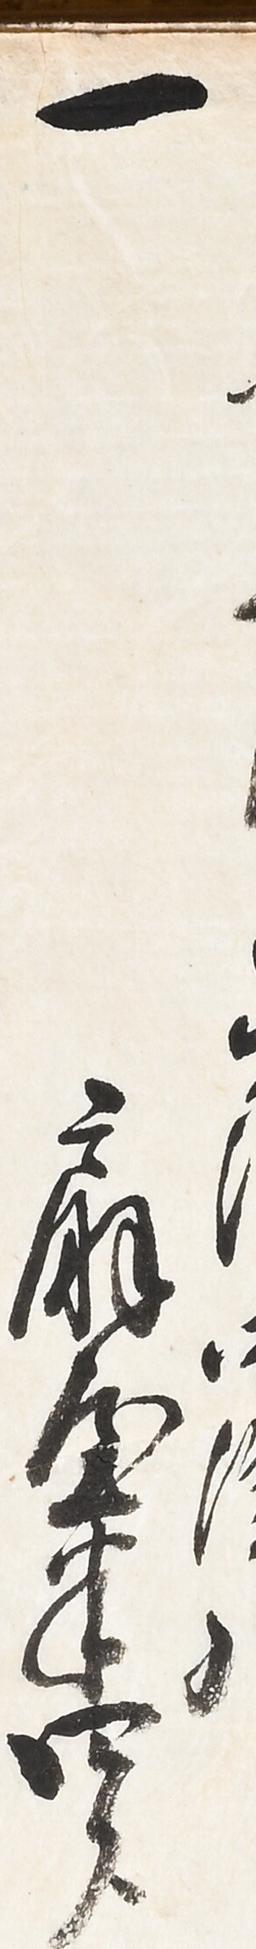一扇屋半四郎
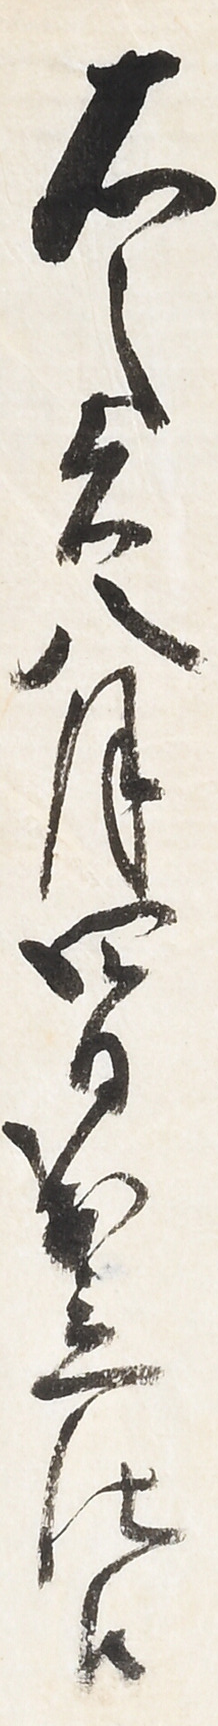右之者八月四日出立仕候
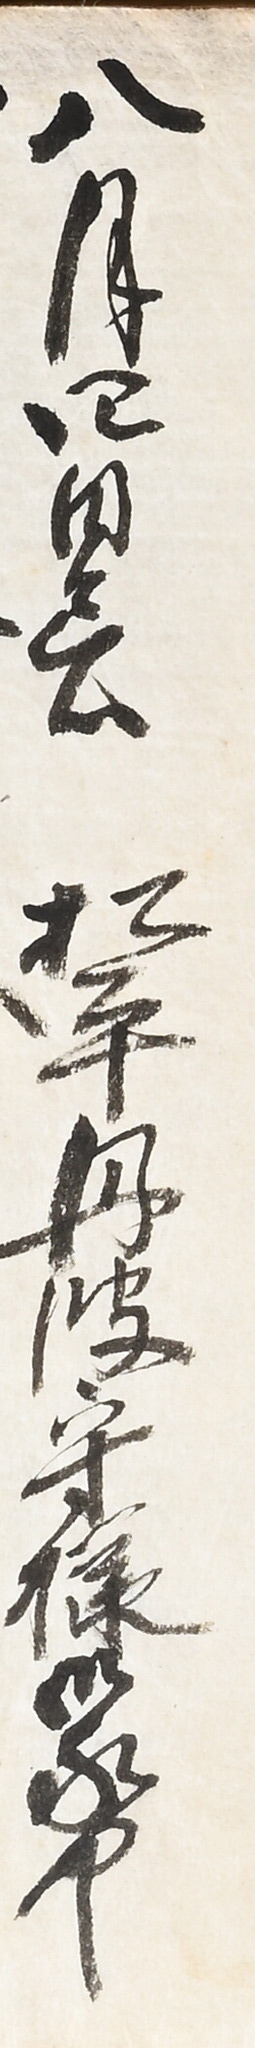八月四日着松平丹波守様御家中
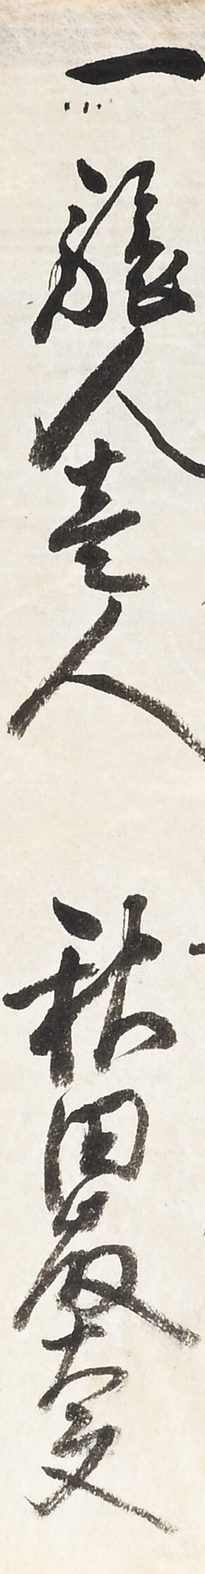一旅人壱人秋田藤大夫
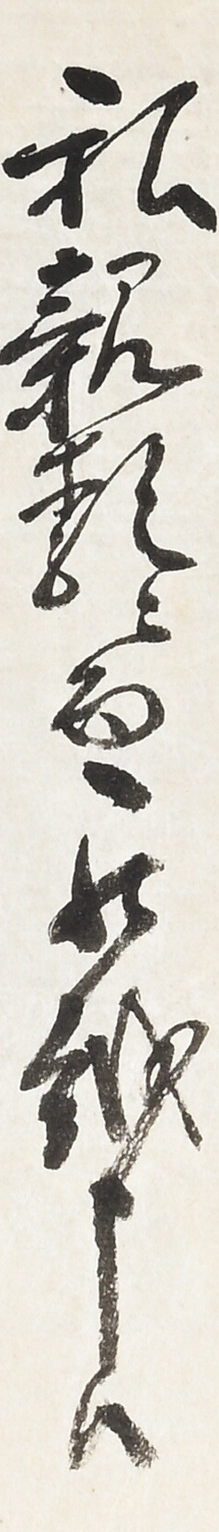私親類ニ而罷越申候
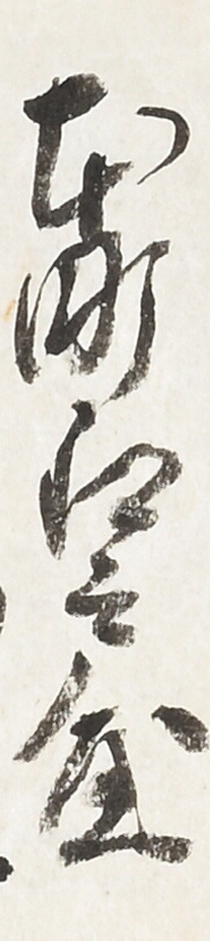本町江戸屋
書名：旅人泊控帳
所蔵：伊那市立高遠町図書館・合同会社AMANE
